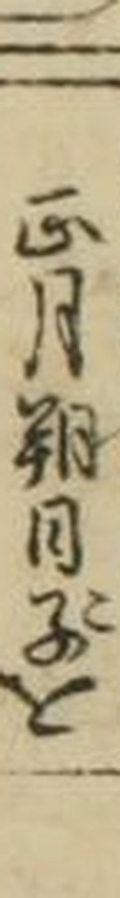正月朔日子を
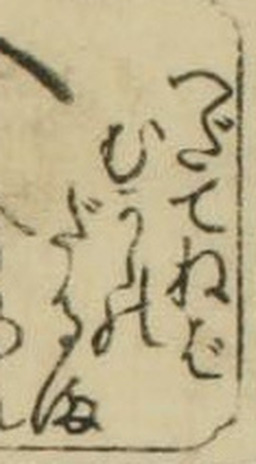むかしの
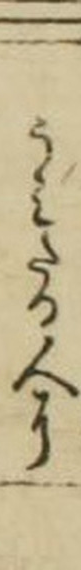うみたる人に
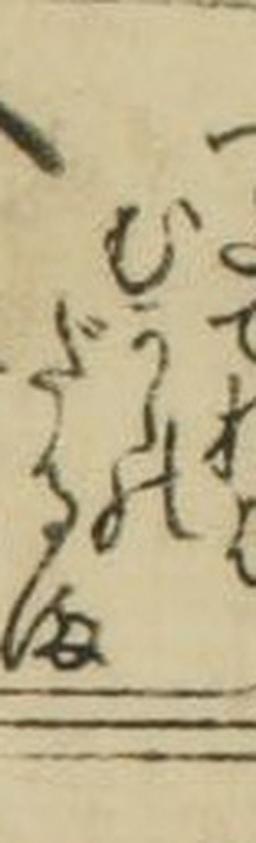だるま
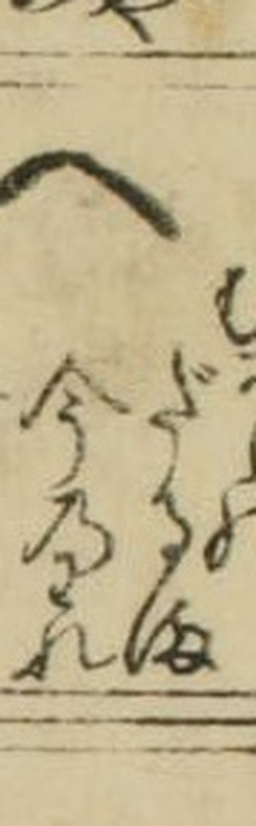今のわれ
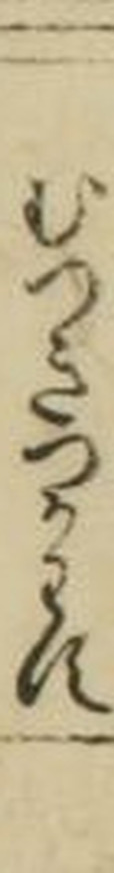むつきつかわす
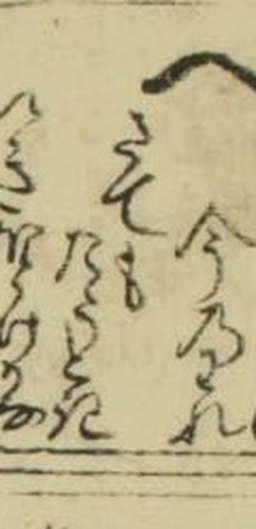さても
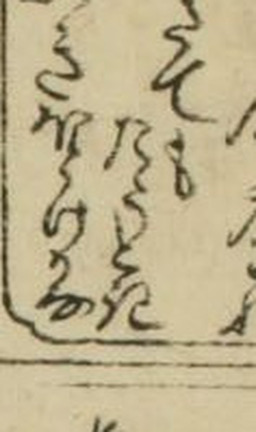たうとき
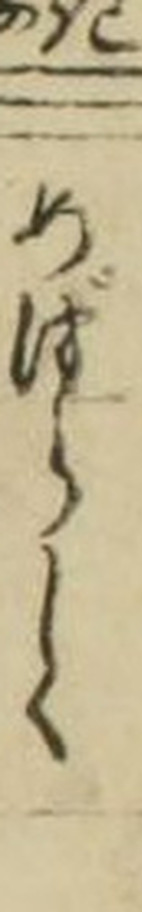めづらしく
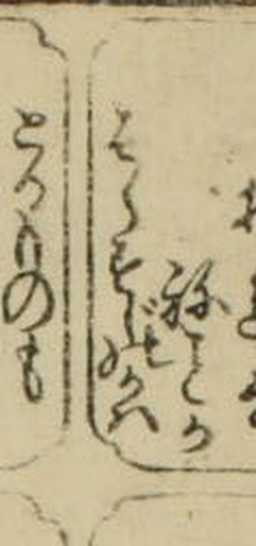はらすじのかは
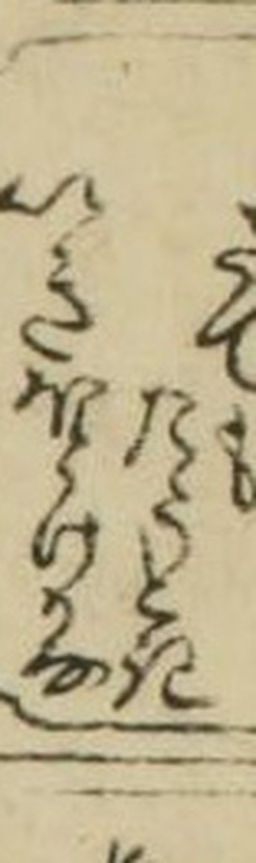いきほとけかな
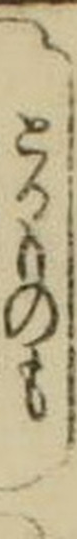とるものも
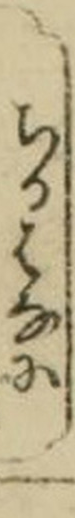ちるはなに
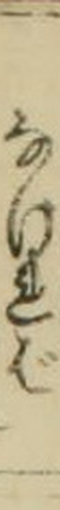なければ
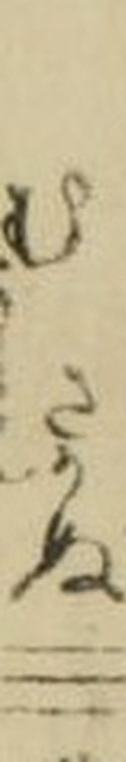さかぬ
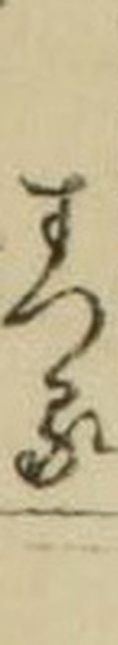すつる
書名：女源氏教訓鑑
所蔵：東京学芸大学附属図書館
